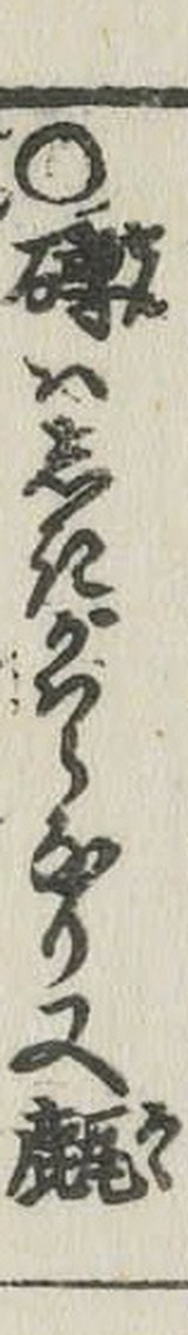○磚はしきがはらなり又㼾
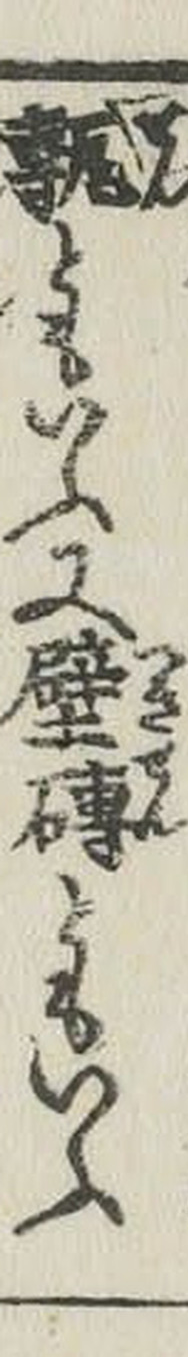甎ともいふ又壁磚ともいふ
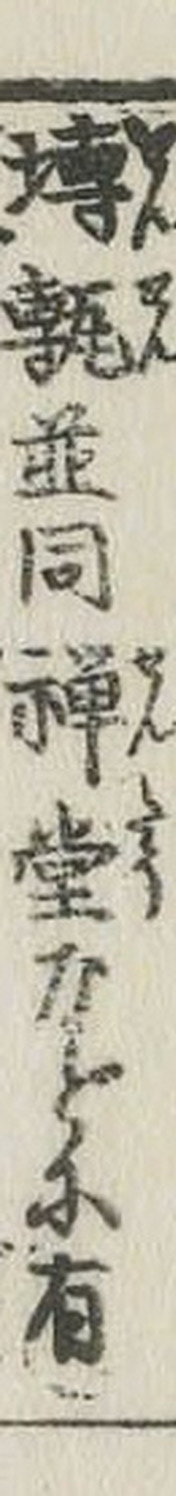塼甎並同禅堂などに有
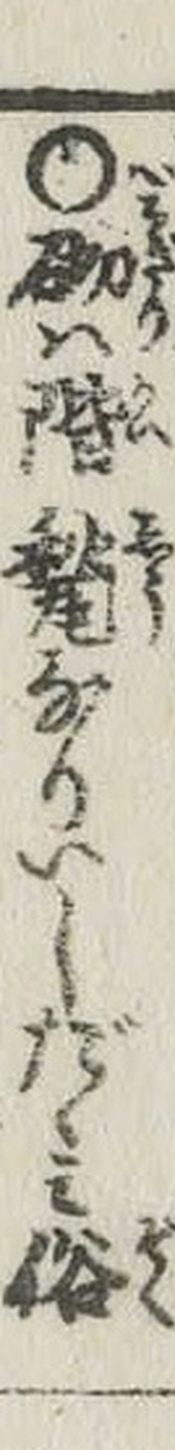○砌は階甃なりいしだゝみ俗
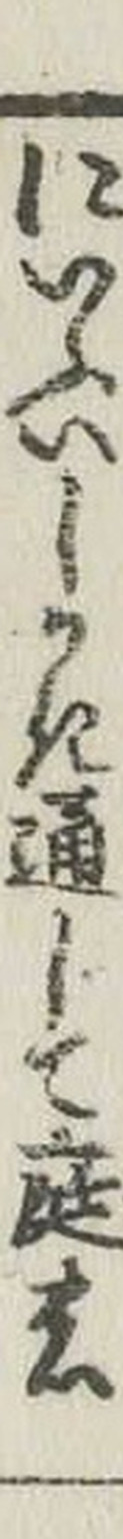にいふいしかき通して庭の
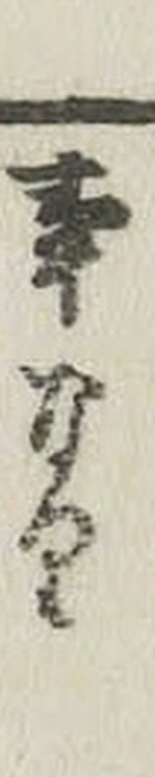事なり
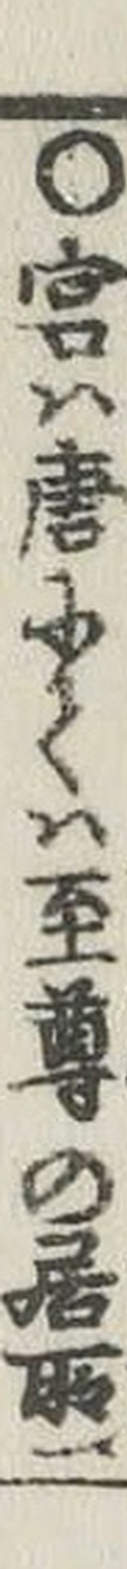○宮は唐にては至尊の居所
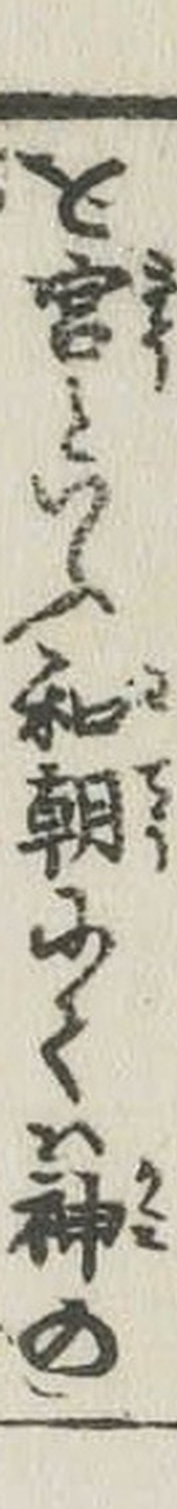を宮といふ和朝にては神の
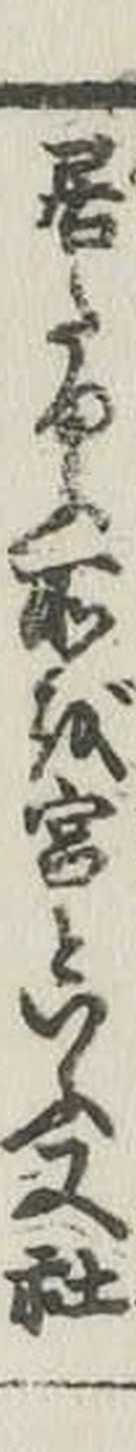居たまふ所を宮といふ又社
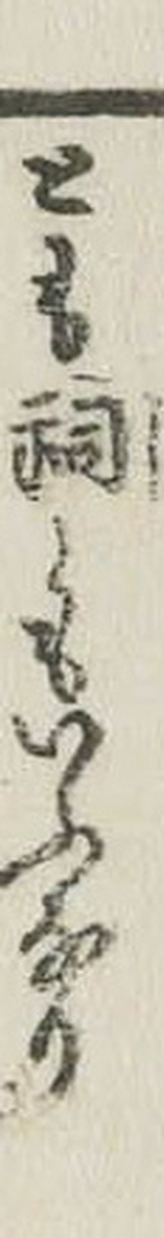とも祠ともいふなり
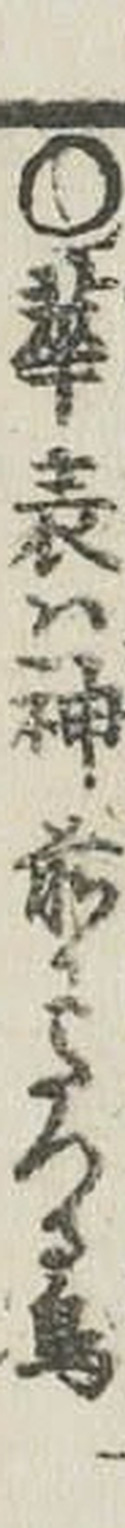○華表は神前にたつる鳥
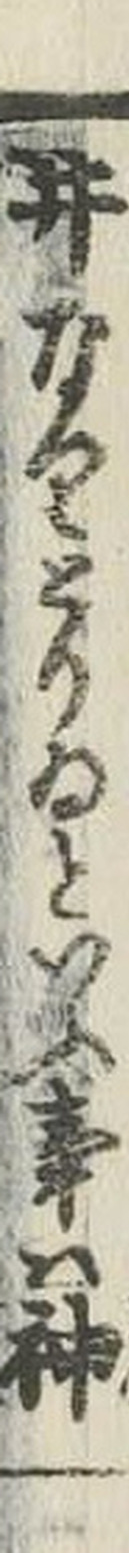井なりとりゐといふ事は神
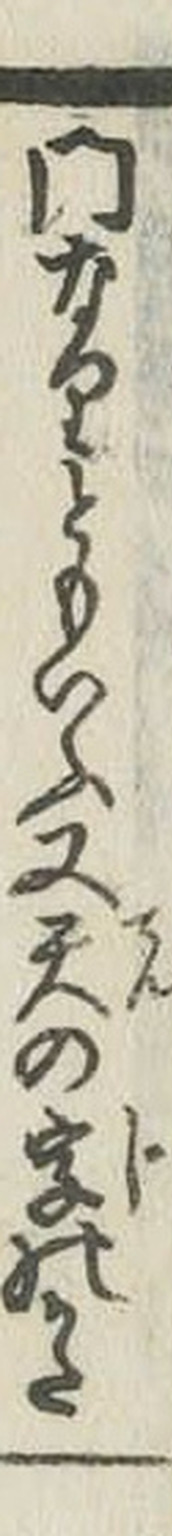門なりともいふ又天の字のかた
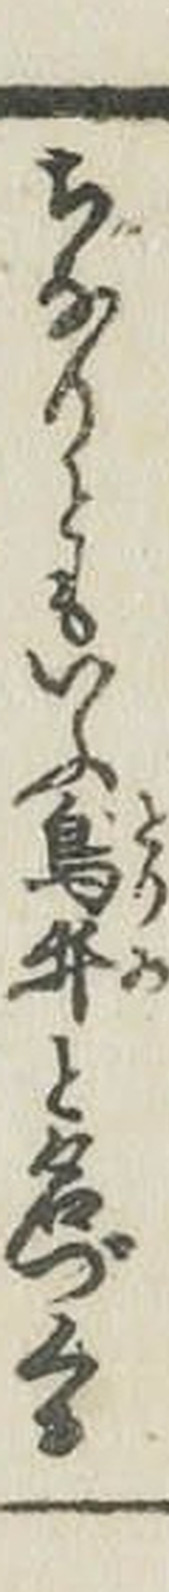ちなりともいふ鳥井と名づくる
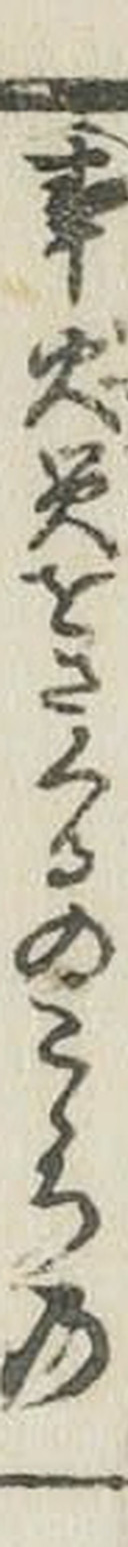事火災をさくるのこゝろの
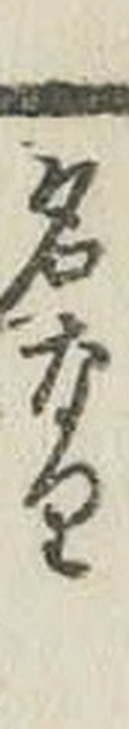名なり
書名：増補頭書訓蒙図彙大成 10巻 2:巻之1-3
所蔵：東京学芸大学教育コンテンツアーカイブ
